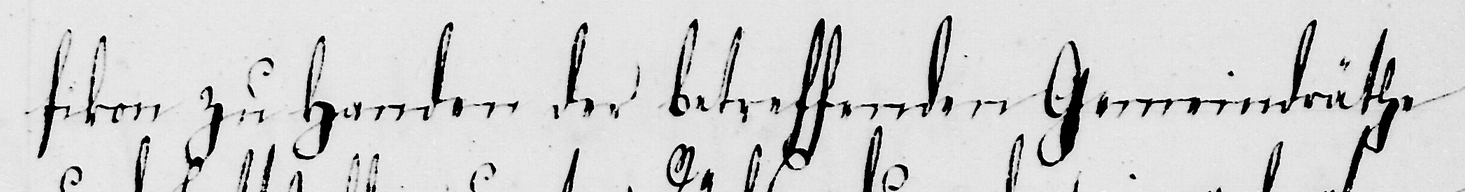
fikon zu Handen der betreffenden Gemeindräthe
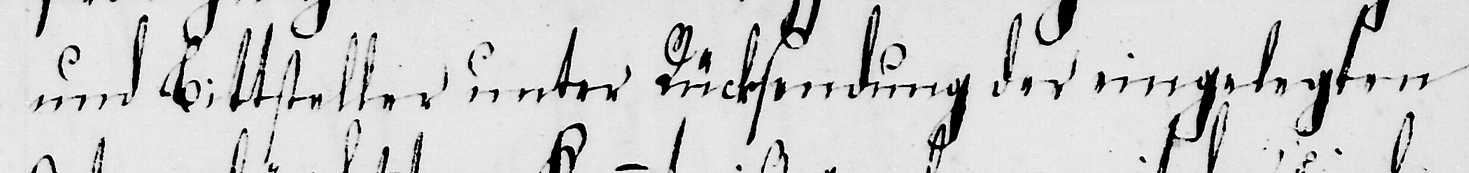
und Bittsteller unter Rücksendung der eingelegten
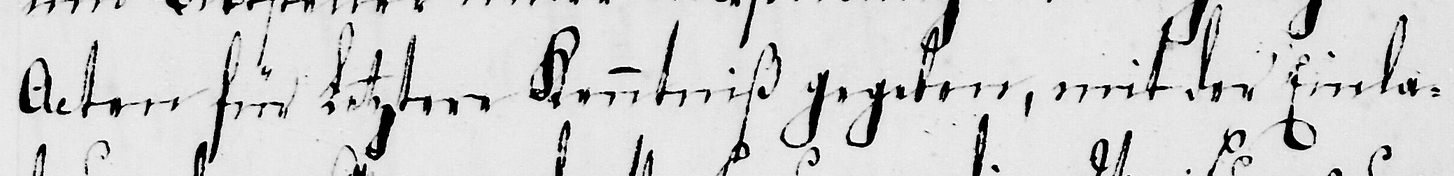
Acten für Letztere Kenntniß gegeben, mit der Einla¬
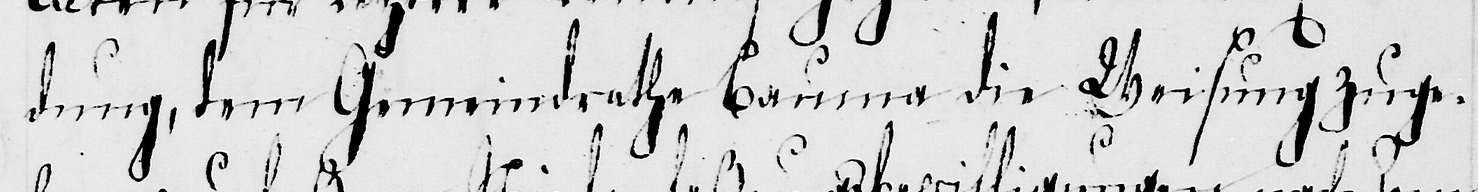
dung, dem Gemeindrathe Bauma die Weisung zuge¬
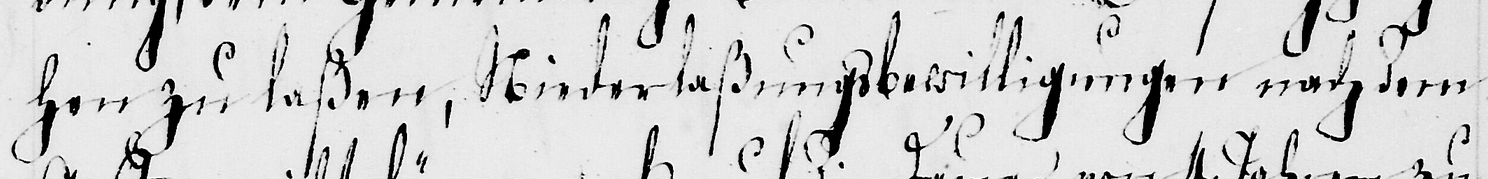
hen zu laßen, Niederlaßungsbewilligungen nach dem
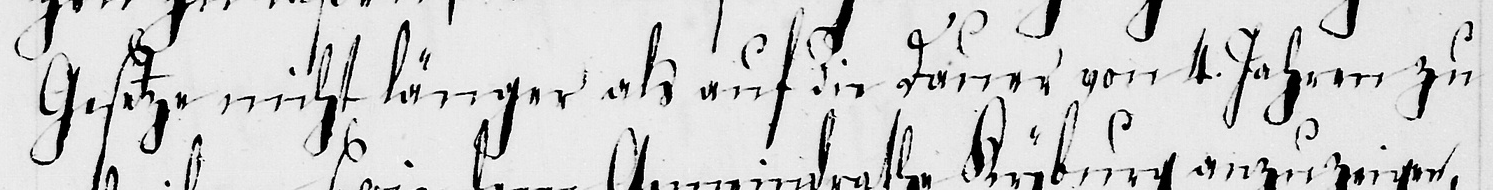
Gesetze nicht länger als auf die Dauer von 4. Jahren zu
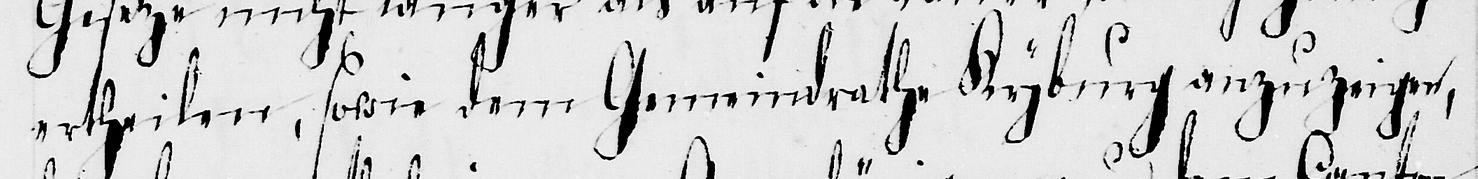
ertheilen, sowie dem Gemeindrathe Kyburg anzuzeigen,
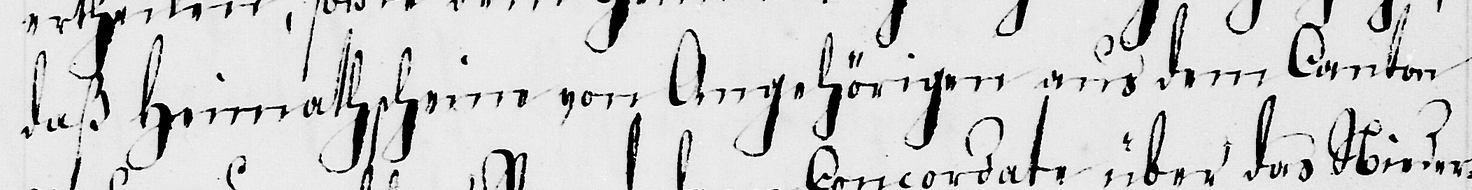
daß Heimathscheine von Angehörigen aus dem Canton
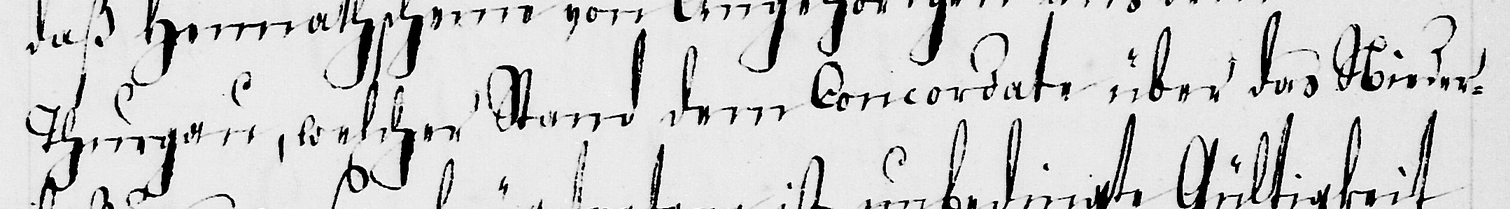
Thurgau, welcher Stand dem Concordate über das Nieder¬
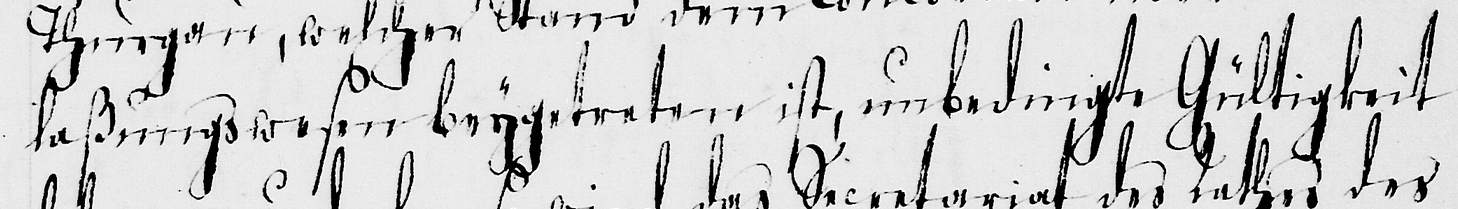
laßungswesen beygetreten ist, unbedingte Gültigkeit
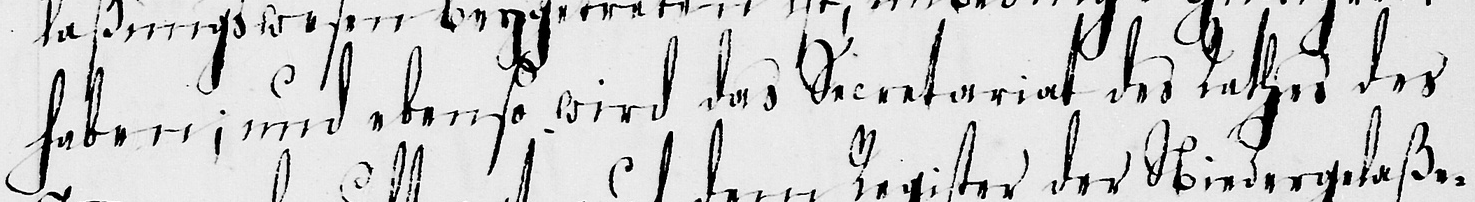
haben; und ebenso wird das Secretariat des Rathes des
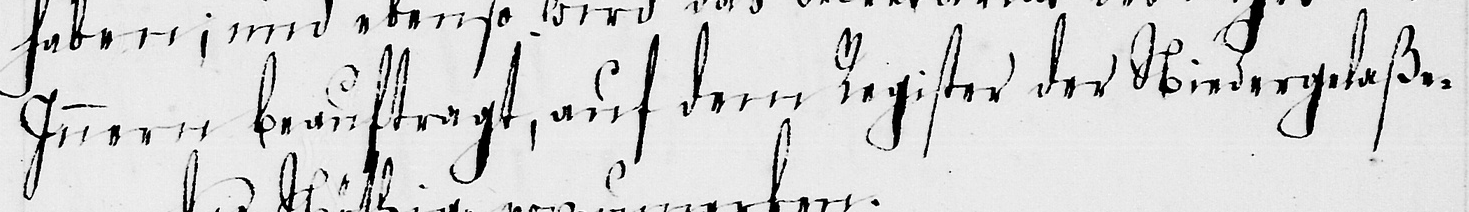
Innern beauftragt, auf dem Register der Niedergelaße¬
